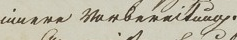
innere Vorbereitung.
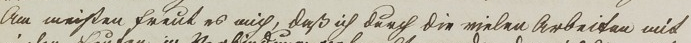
Am meisten freut es mich, daß ich durch die vielen Arbeiten mit
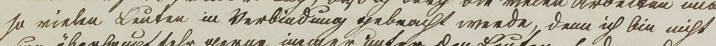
so vielen Leuten in Verbindung gebracht werde, denn ich bin nicht
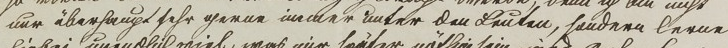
nur überhaupt sehr gerne immer unter den Leuten, sondern lerne
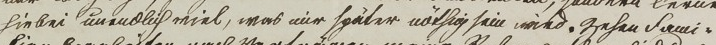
hiebei unendlich viel, was mir später nöthig sein wird. Zehen Fami-
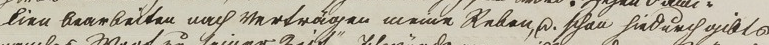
lien bearbeiten nach Verträgen meine Reben, &. schon hiedurch gibts
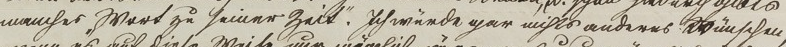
manches «Wort zu seiner Zeit». Ich würde gar nichts anderes Wünschen,
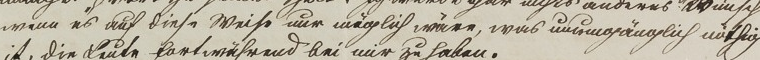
wenn es auf diese Weise nur möglich wäre, was unumgänglich nöthig
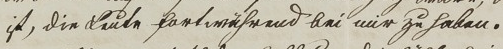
ist, die Leute fortwährend bei mir zu haben.
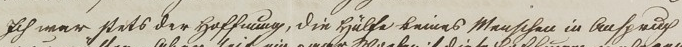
Ich war stets der Hoffnung, die Hülfe keines Menschen in Anspruch
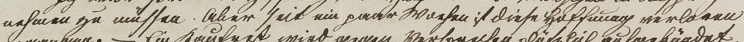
nehmen zu müssen. Aber seit ein paar Wochen ist diese Hoffnung verloren
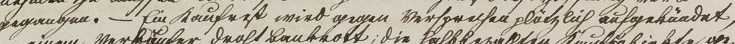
gegangen. – Ein Kaufrest wird gegen Versprechen plötzlich aufgekündet,
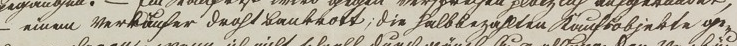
– einem Verkäufer droht Bankrott; die halbbezahlten Kaufsobjekte ge-
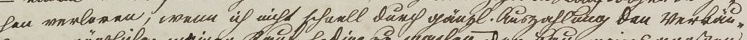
hen verloren, wenn ich nicht schnell durch gänzl. Auszahlung den Verkäu-
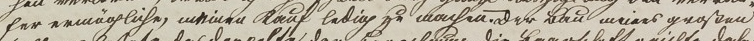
fer ermögliche, meinen Kauf ledig zu machen. Der Bau meines großen
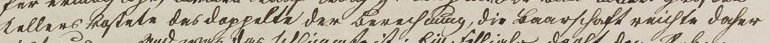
Kellers kostete das doppelte der Berechnung, die Baarschaft reichte daher
